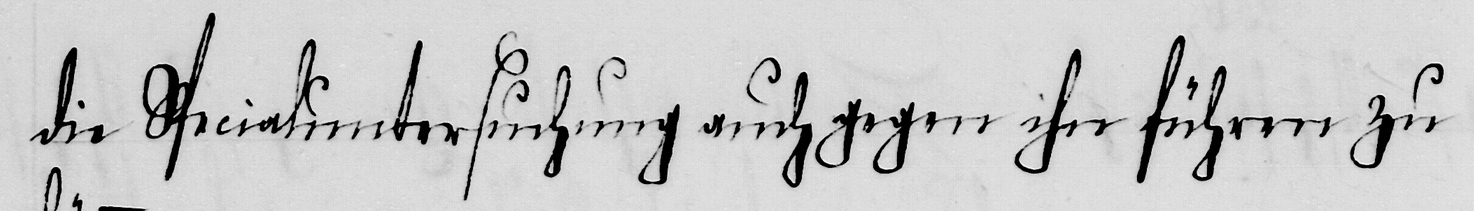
die Specialuntersuchung auch gegen ihn führen zu
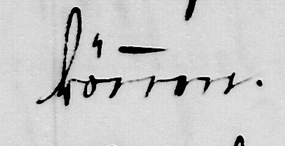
können.
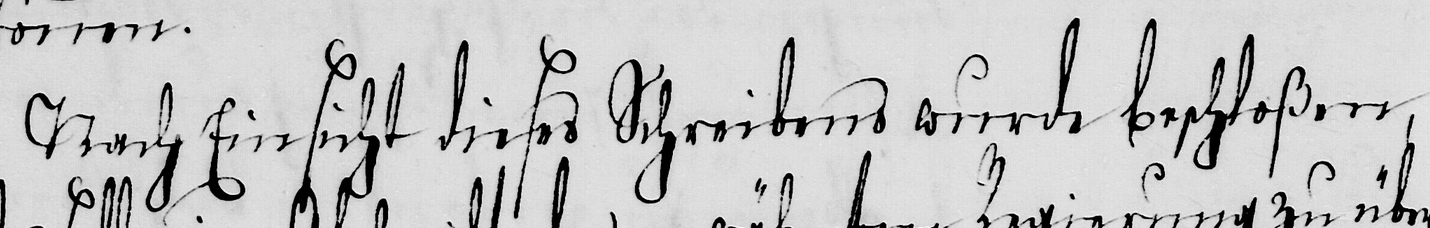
Nach Einsicht dieses Schreibens wurde beschloßen,
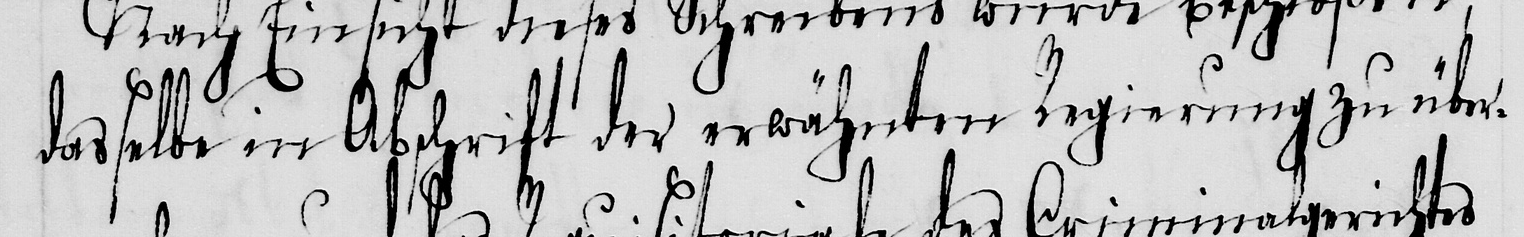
dasselbe in Abschrift der erwähnten Regierung zu übe¬
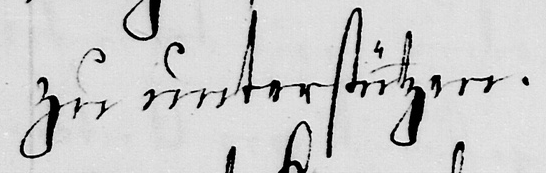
zu unterstützen.
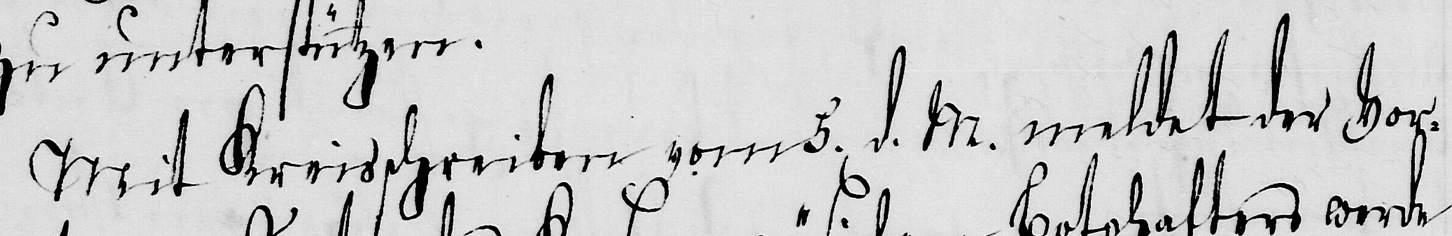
Mit Kreisschreiben vom 5. d. M. meldet der Vor¬
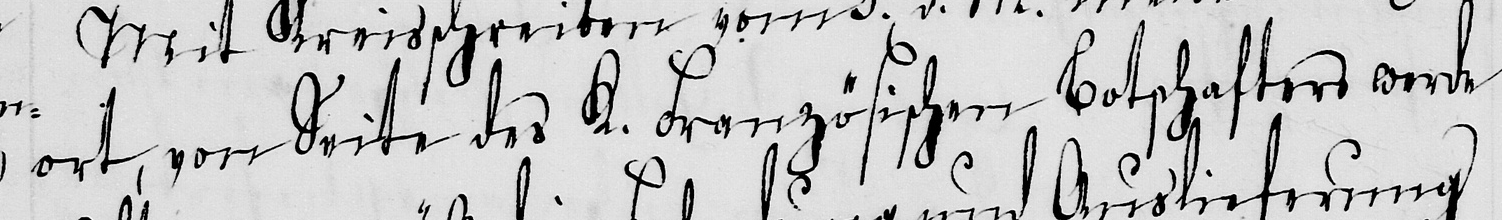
ort, von Seite des K. Französischen Botschafters werde
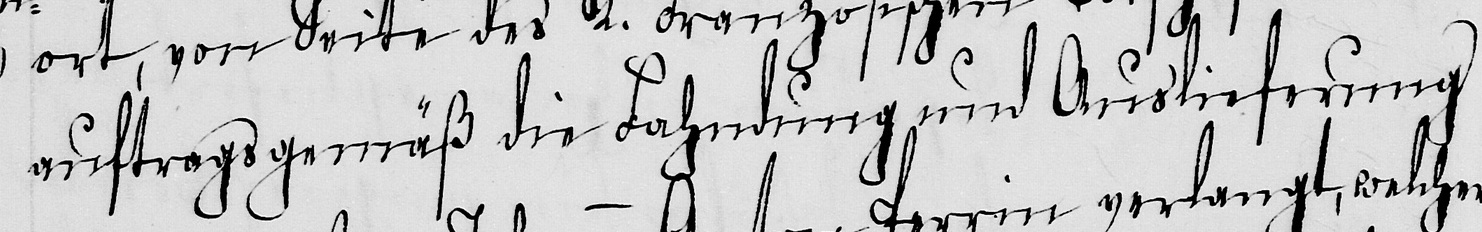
auftragsgemäß die Fahndung und Auslieferung
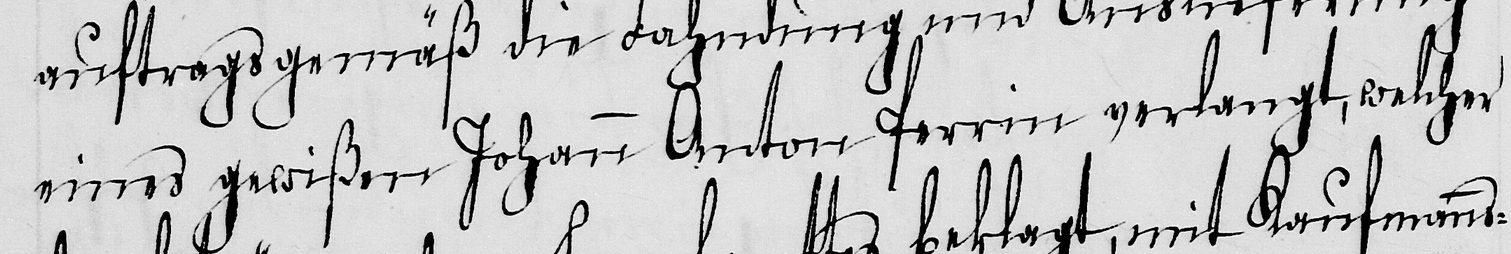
eines gewißen Johann Anton Perrin verlangt, welcher
